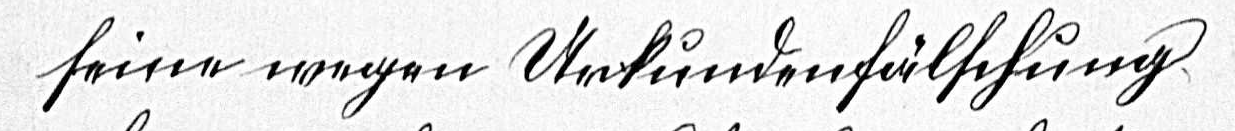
seine wegen Urkundenfälschung
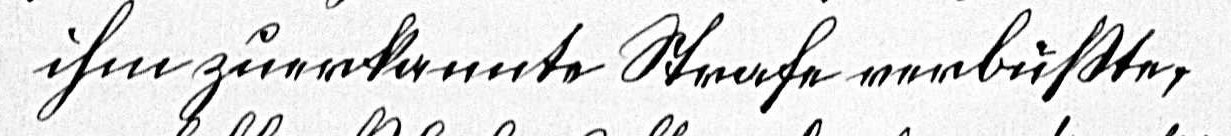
ihm zuerkannte Strafe verbußte,
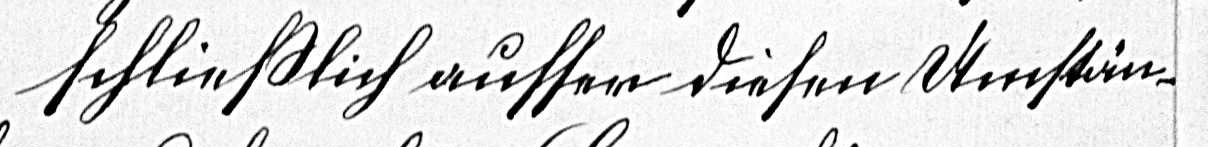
schließlich ausser diesen Umstän¬
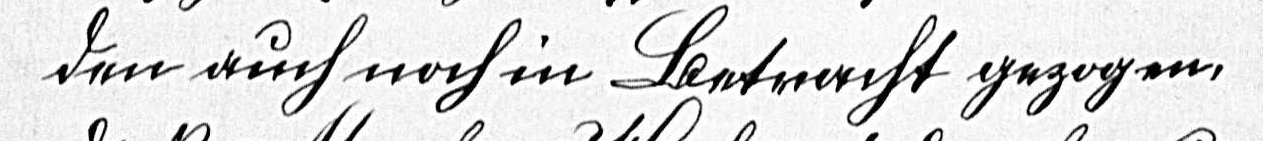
den auch noch in Betracht gezogen,
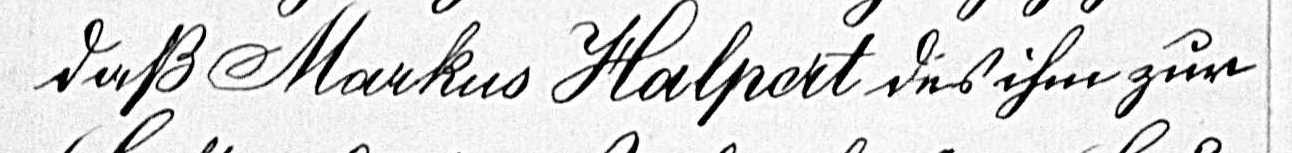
daß Markus Halpert des ihm zur
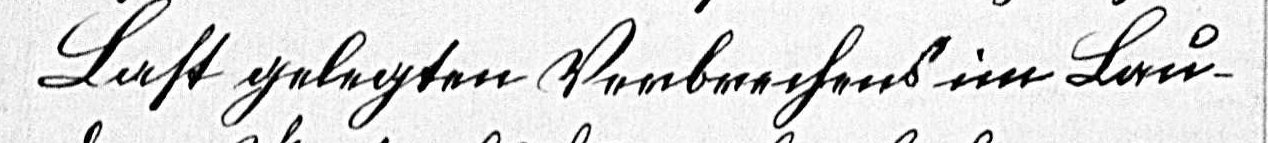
Last gelegten Verbrechens im Lau¬
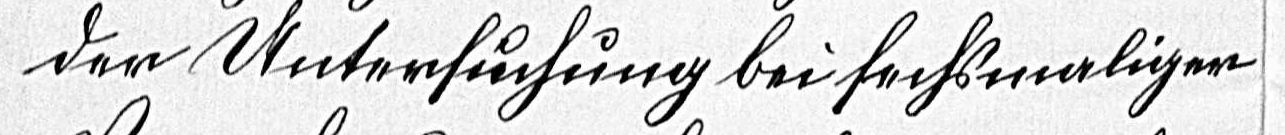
der Untersuchung bei sechsmaliger
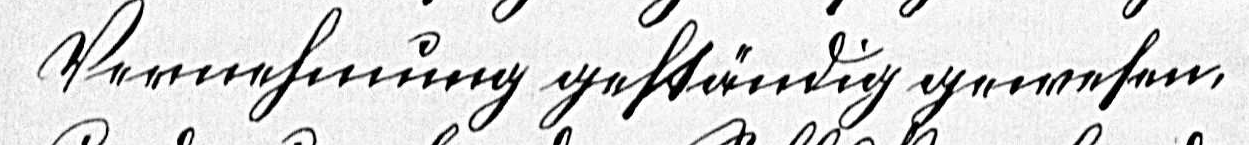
Vernehmung geständig gewesen,
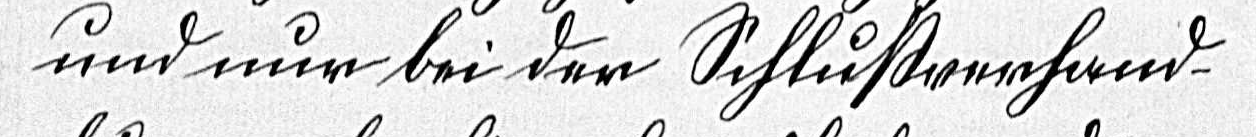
und nur bei der Schlußverhand¬
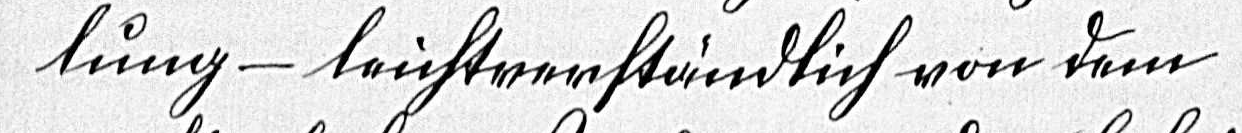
lung - leichtverständlich von dem
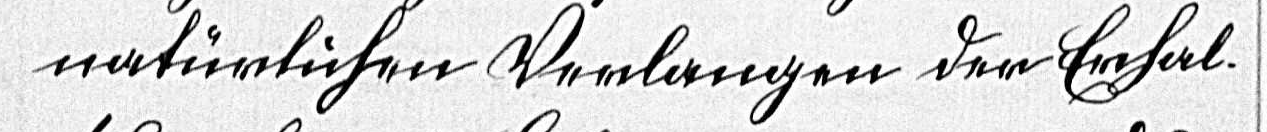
natürlichen Verlangen der Erhal¬
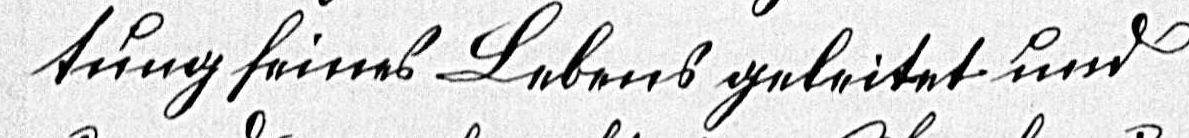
tung seines Lebens geleitet und
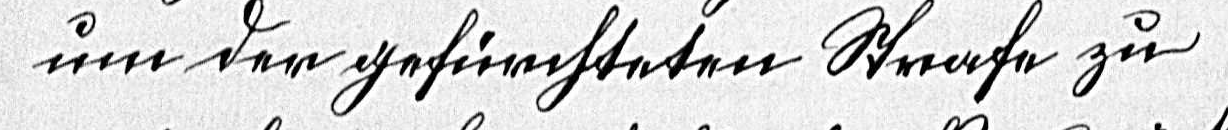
um der gefürchteten Strafe zu
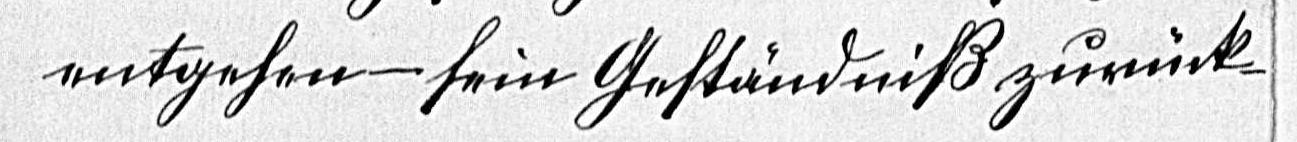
entgehen-sein Geständniß zurück¬
